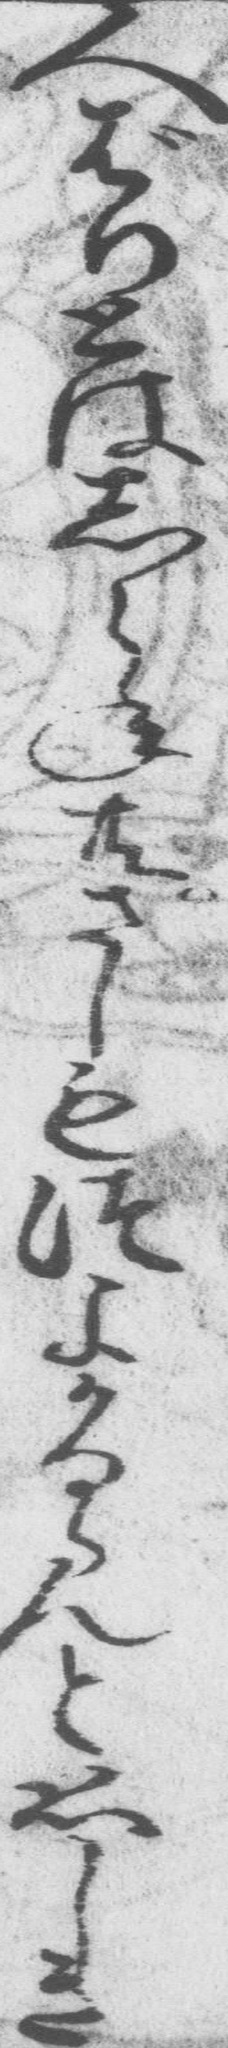人ばりとはしらね共。さしもつよかるらんと思しき
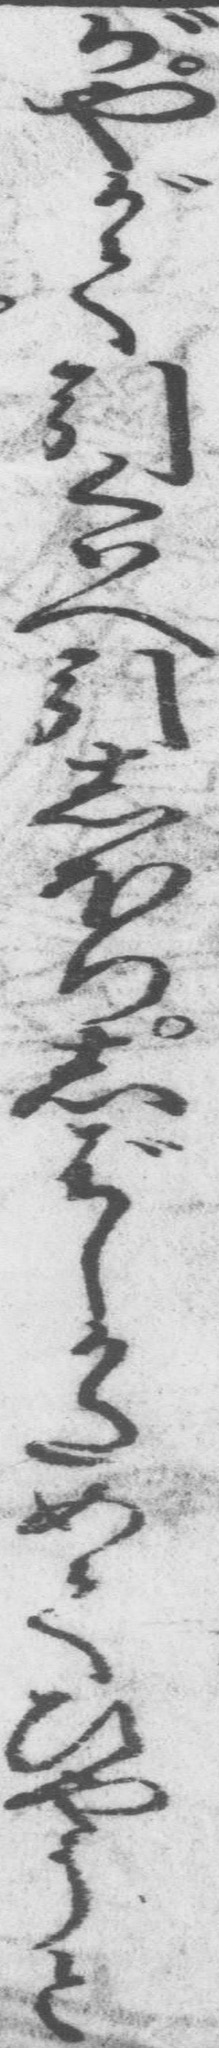が。やがて引くはへ引しぼり。しばしかためてひやうと
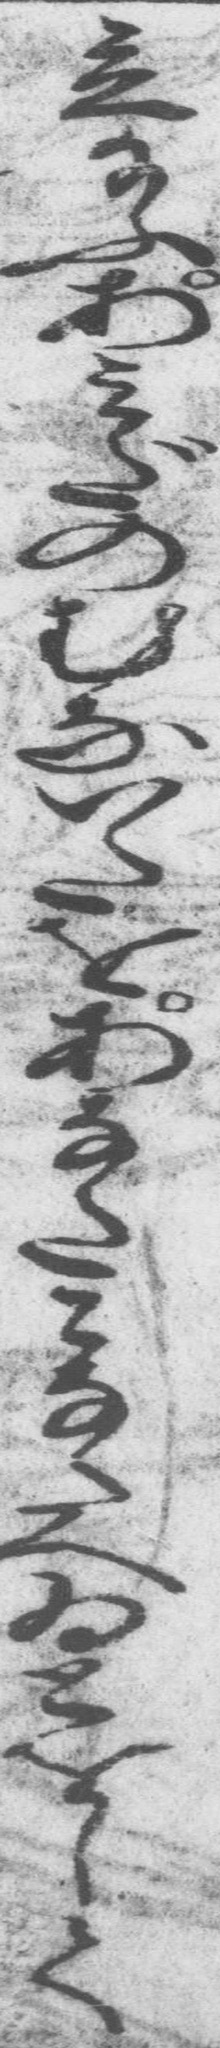立給ふ。あみだのむないたを。あなたこなたへゐとをして
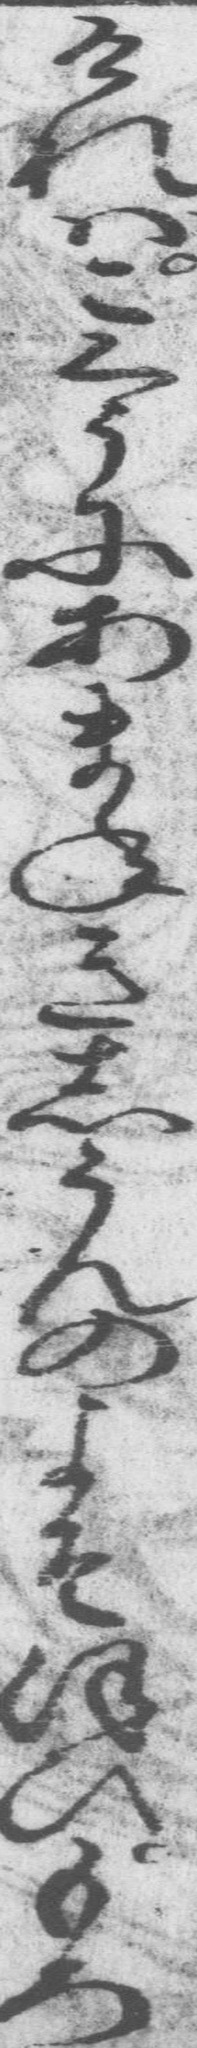ければ。こくうにあまねきしうんのよそほひもろ
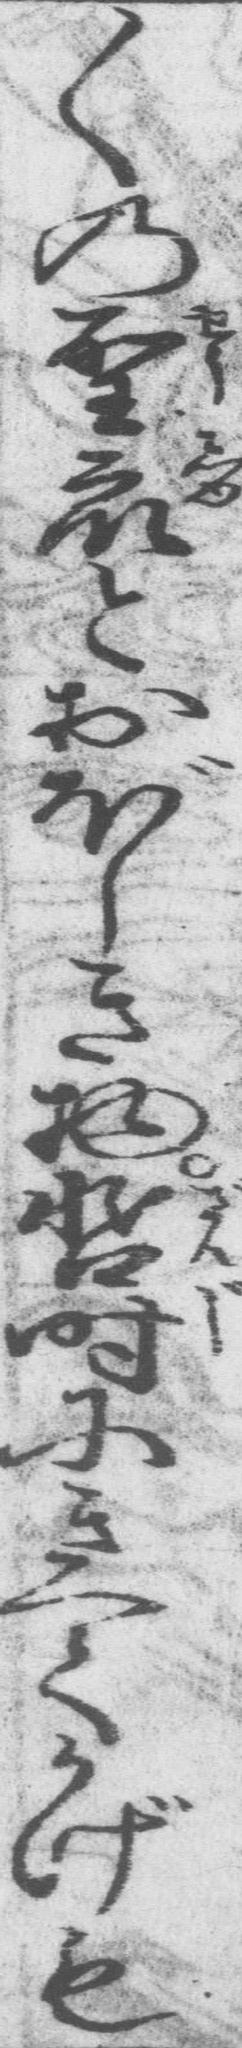〳〵の聖衆とおぼしき物。暫時にきへてかげも

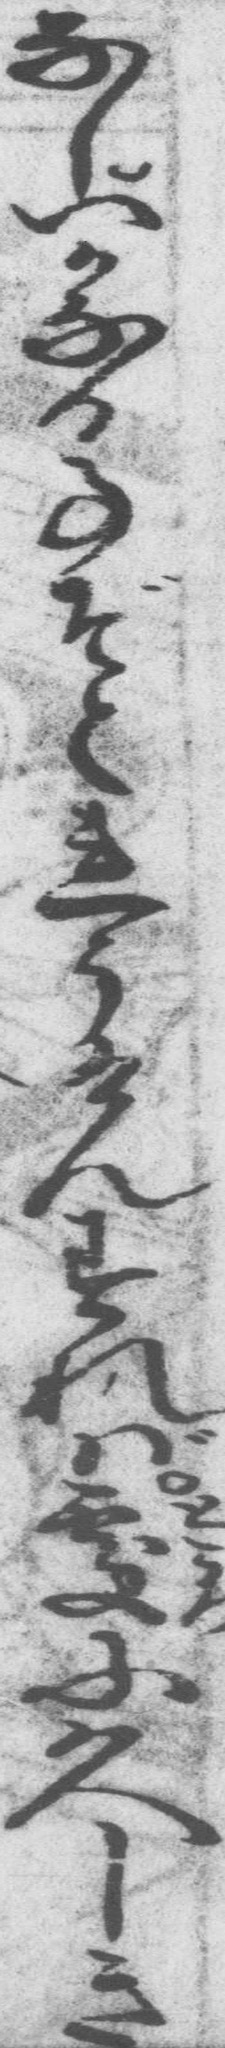なし。いかなる事ぞくれうけんすれば。処に久しき
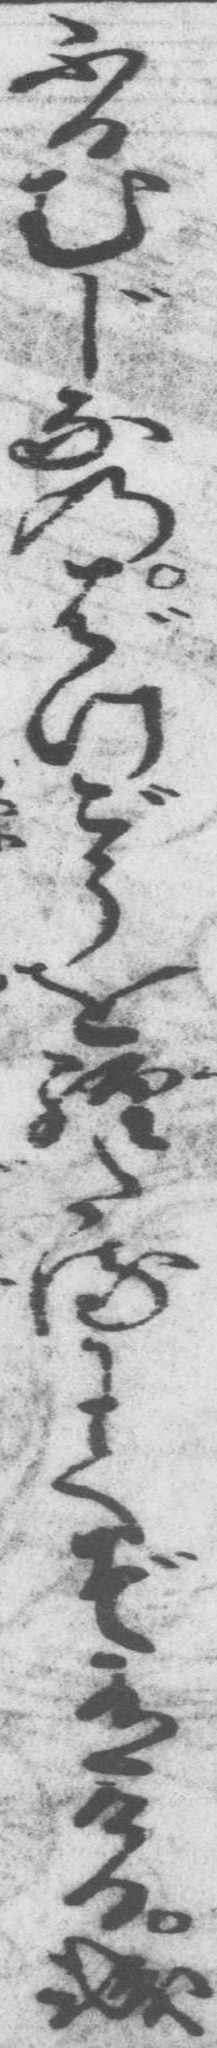ふるむじなの。ばけごうを経たるにくぞ有ける。誠
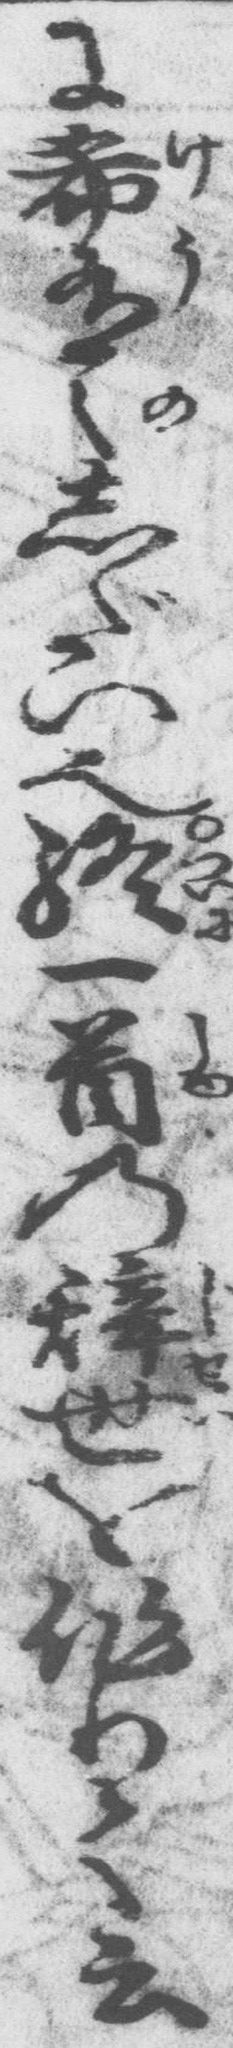に希有之しだい也。終一首の辞世を作りて云
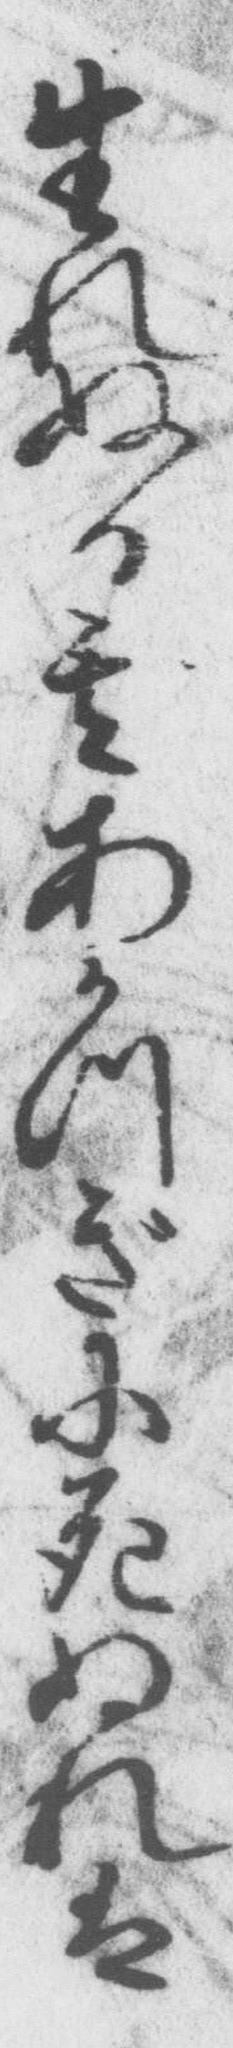生れぬる其あかつぎに死ぬれは
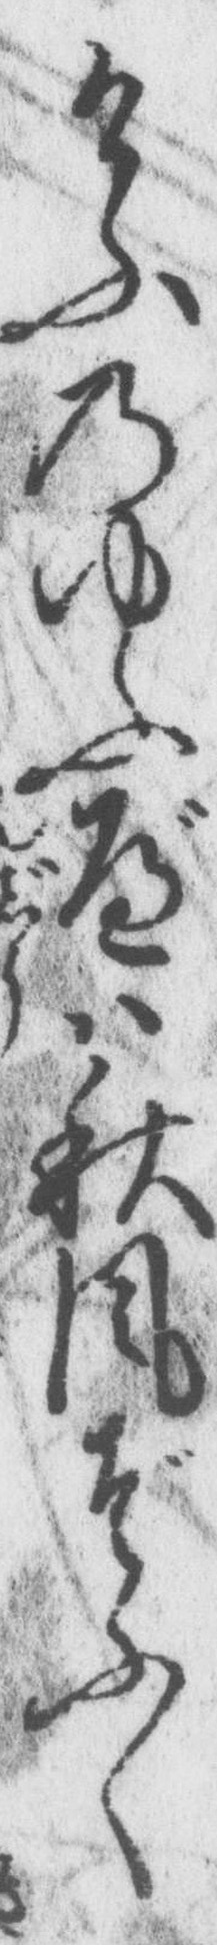けふのゆふべは秋風ぞふく
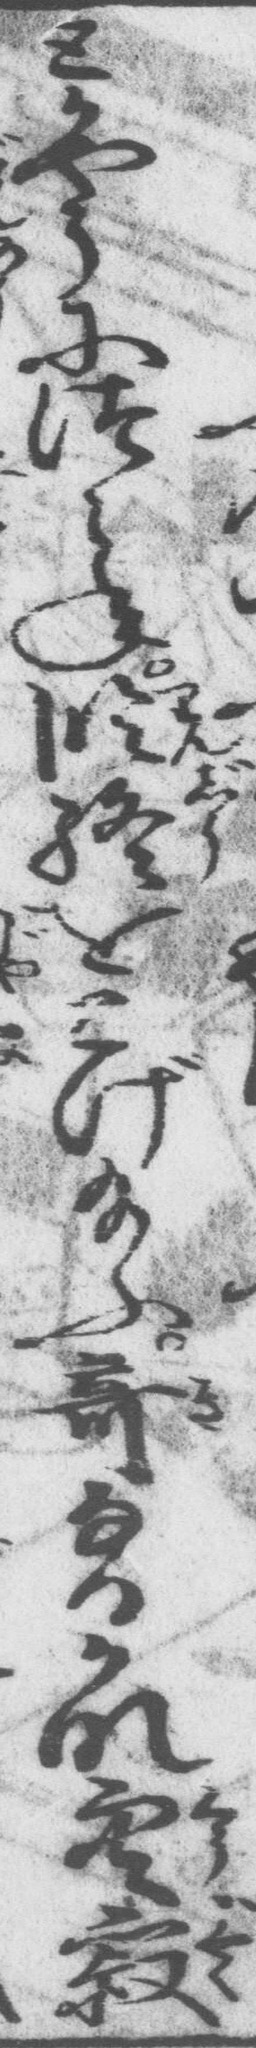とかやうにつらね。臨終をとげ給ふ。奇なるかな空寂
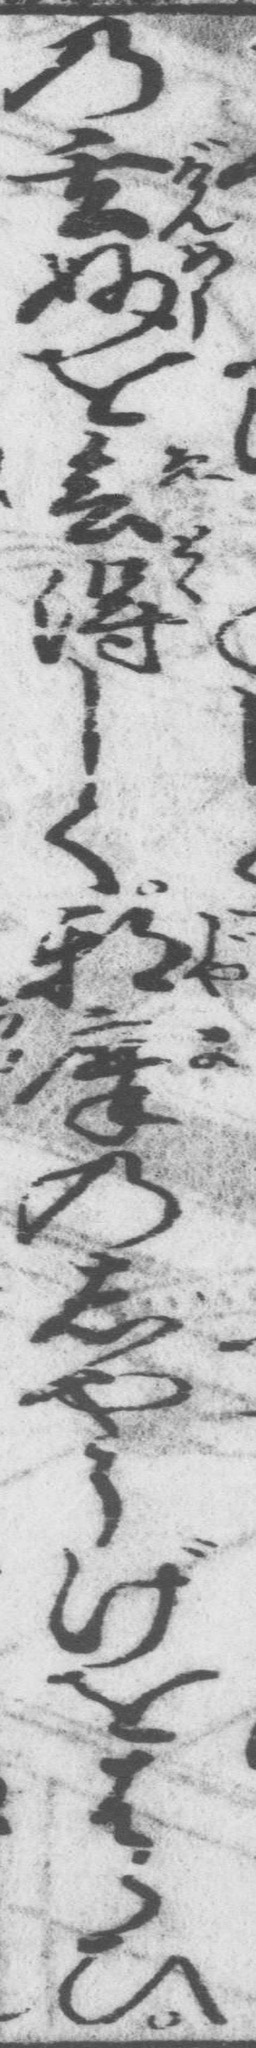の玄妙を会得して。邪摩のしやうげをはらひ
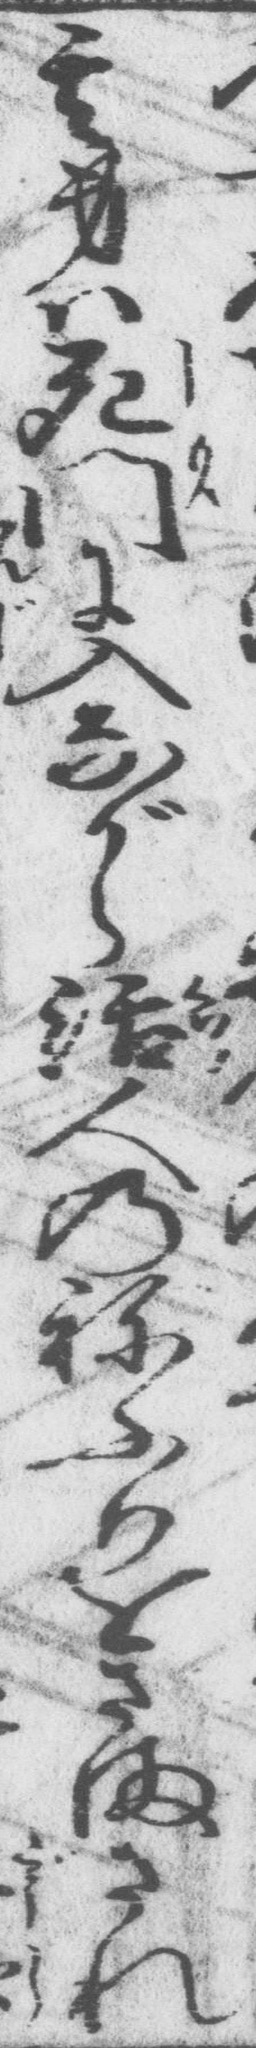其身は死門に入ながら活人のねふりをさまされ
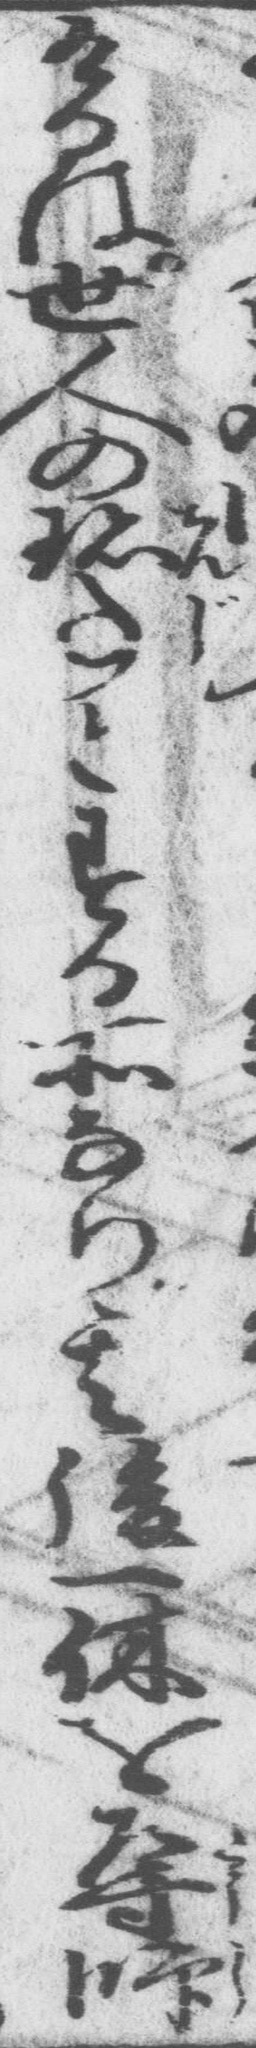けるは。世人の珍事とする所なり。其後一休を導師
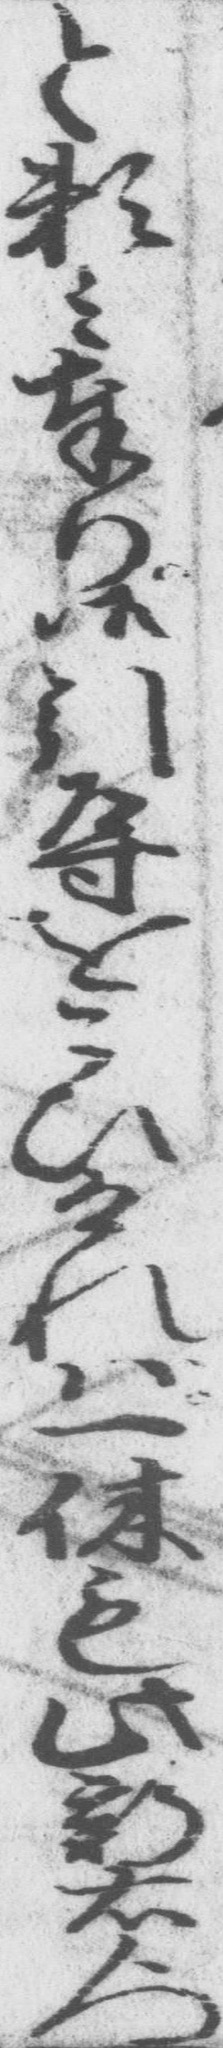と頼み奉り。御引導をこひければ一休も此新右の
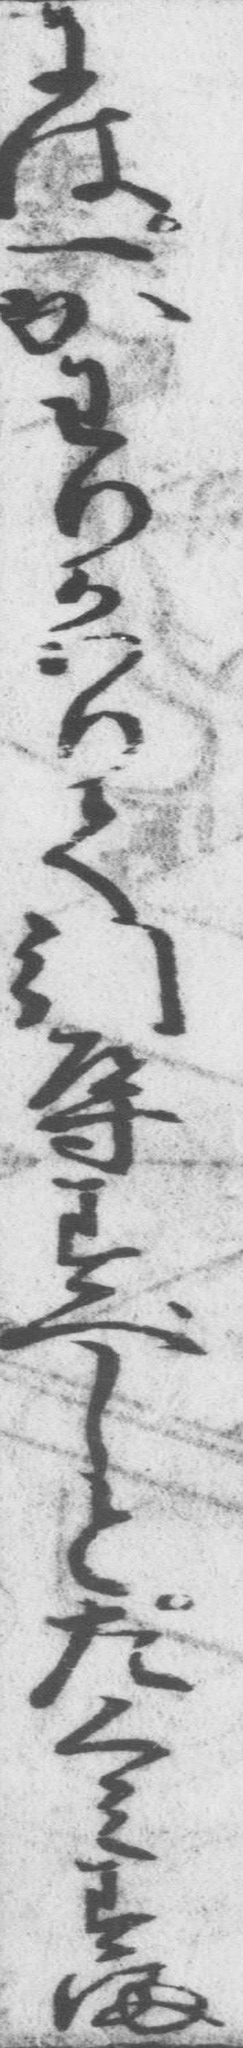には。一かわりかはりて引導すべしと。たくみすま
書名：一休はなし（元禄十三）
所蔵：大阪公立大学中百舌鳥図書館 国文学研究資料館
